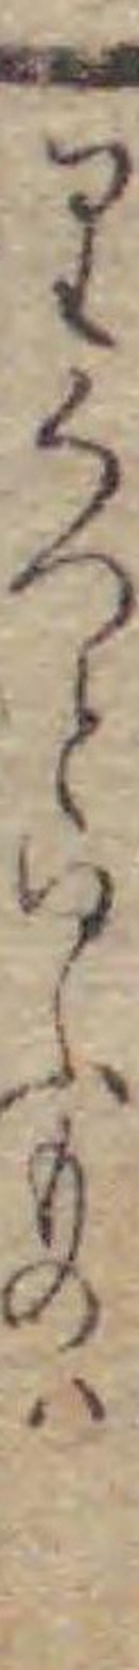りくつといふものは
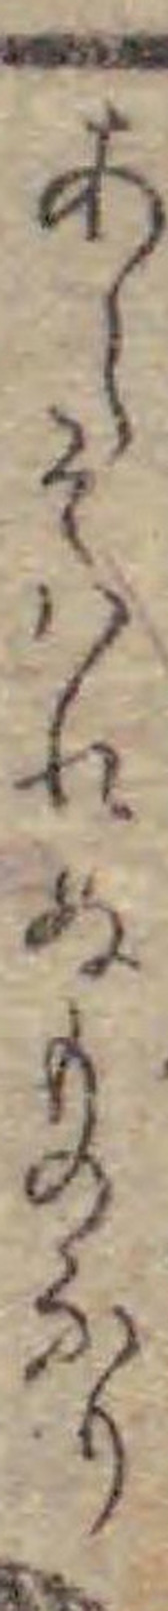あらそはれぬものなり
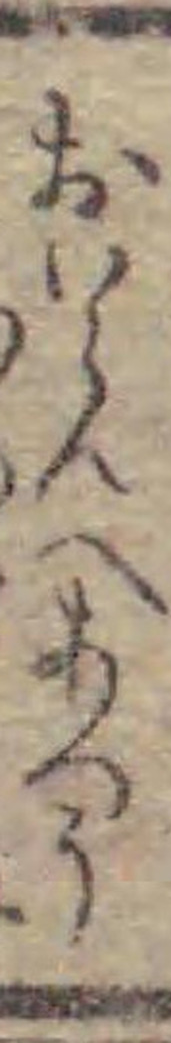おいらんへあつう
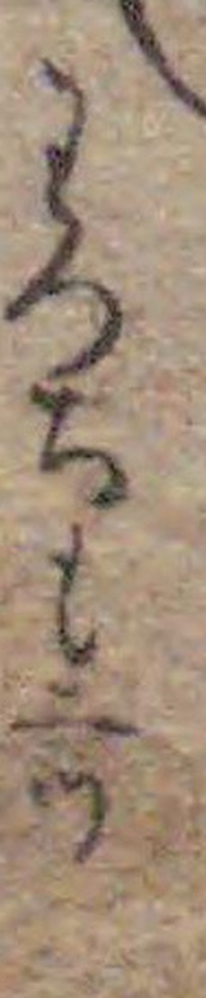わつちも二つ
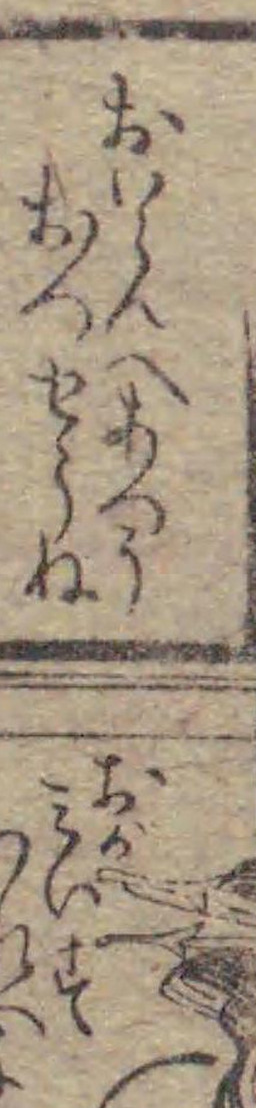おいらんへあつう
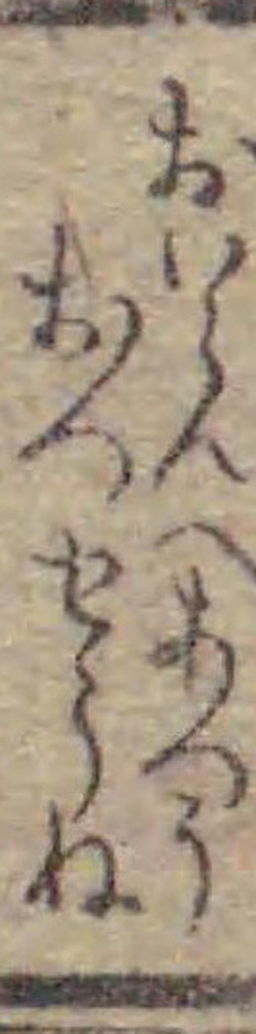おつせうね
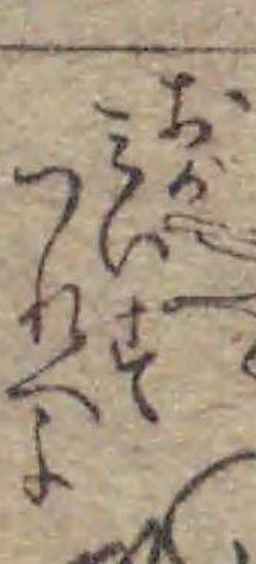みいす
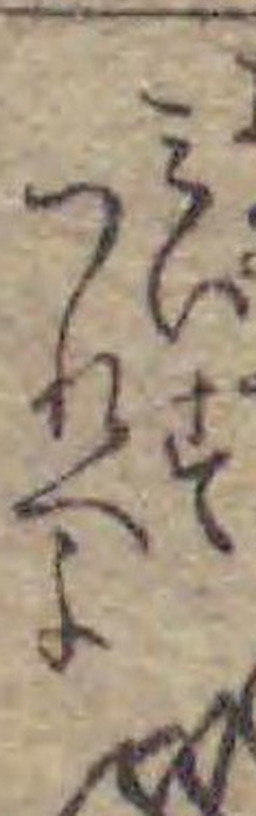つれへよ

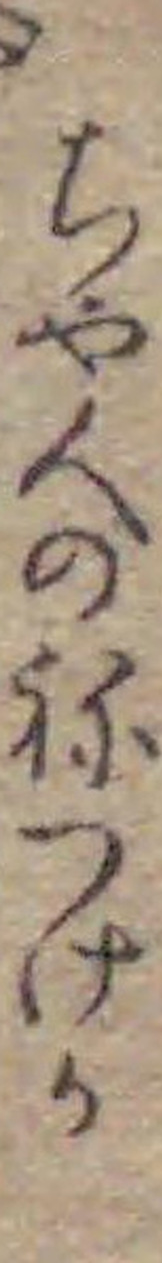ちや人のねつけか
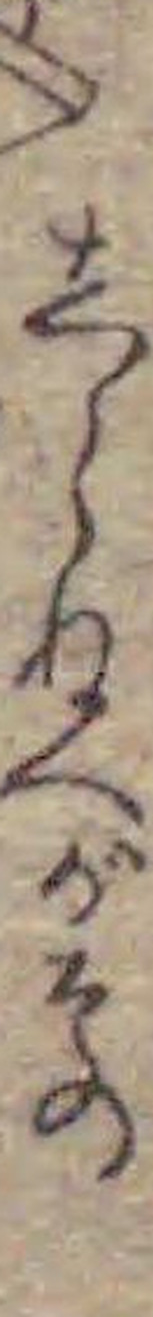しらねへがそのはち
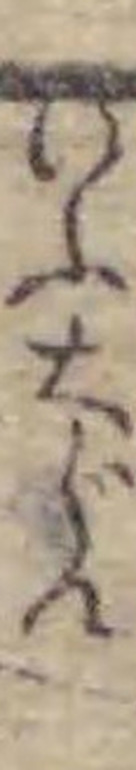いふ大じん
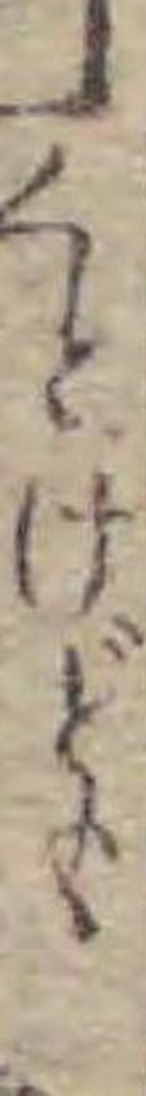くとけども
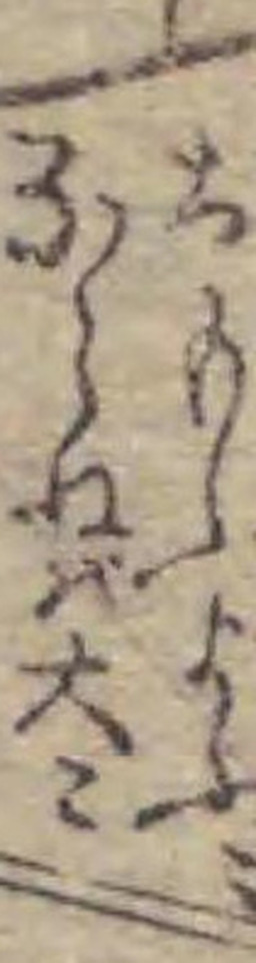ならねば大に
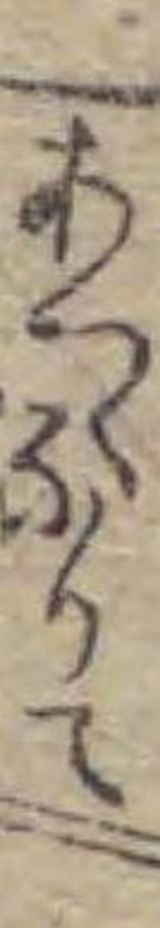あつくなりて
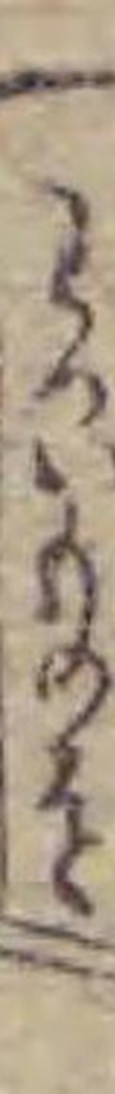わかいものを
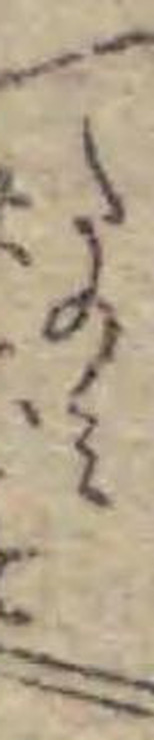たのみ
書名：江戸花俳優贔屓 : 3巻
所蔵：国立国会図書館 National Diet Library, JAPAN
